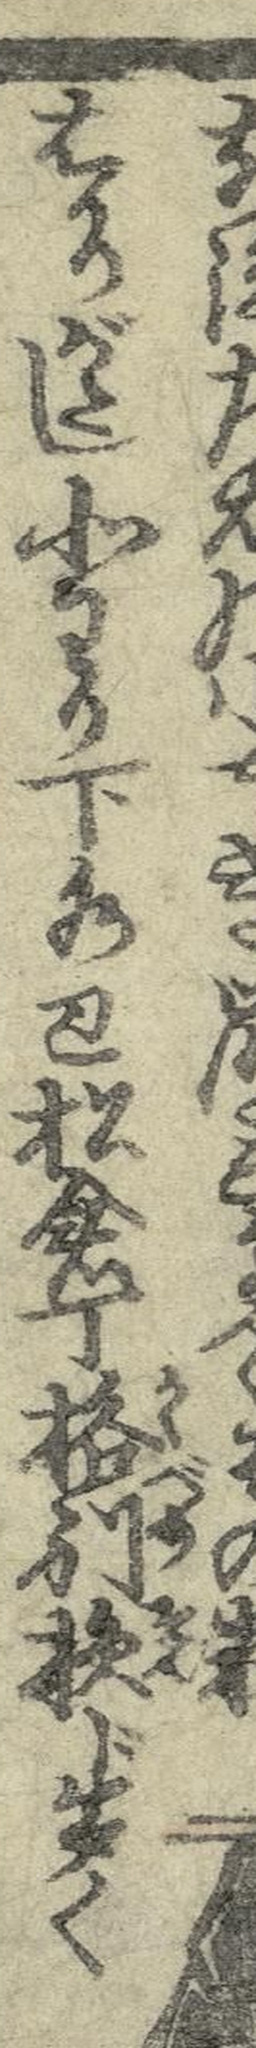はかりがたし北わり下水辺松倉丁格別損じ多く
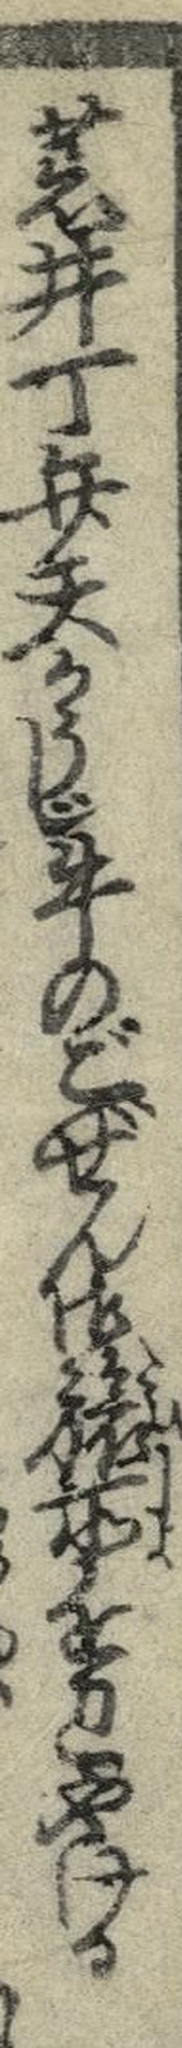芝井丁弁天かうじ牛のごぜん御旅所近辺やける
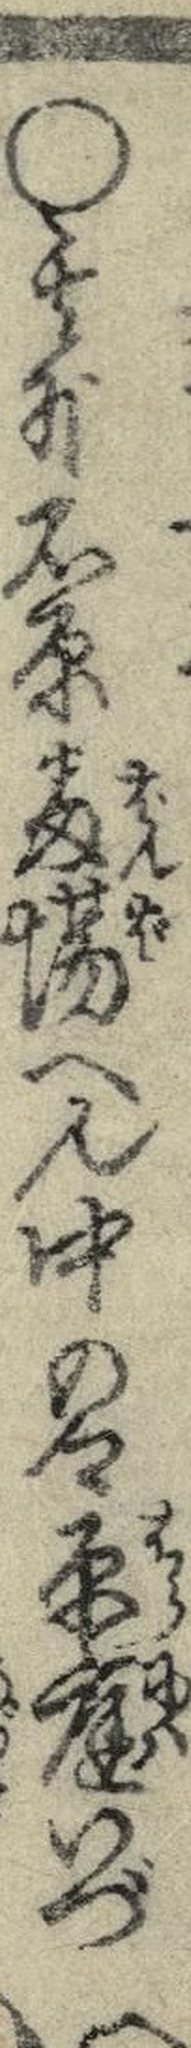○其他石原番場へん中の郷原庭いづ
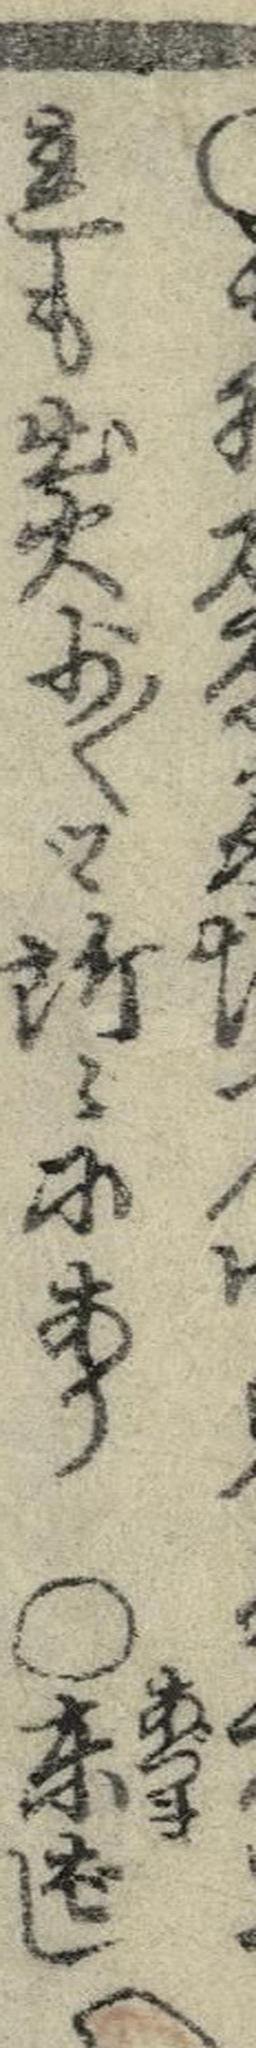れも出火少〳〵ツヽ所々にあり○東ばし
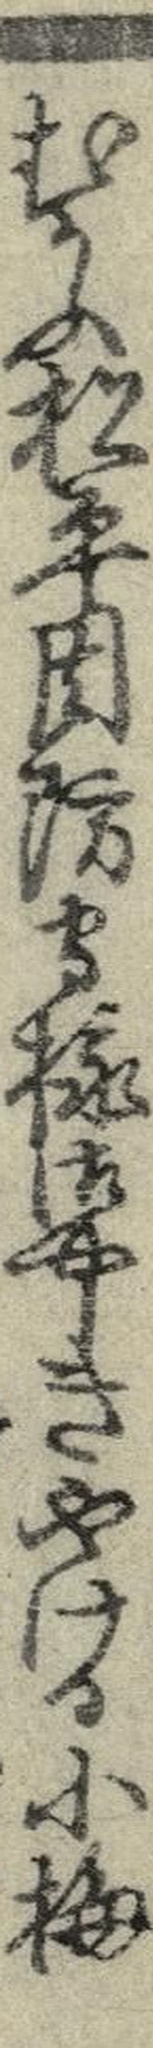むかふ松平周防守様御やしき焼ける小梅
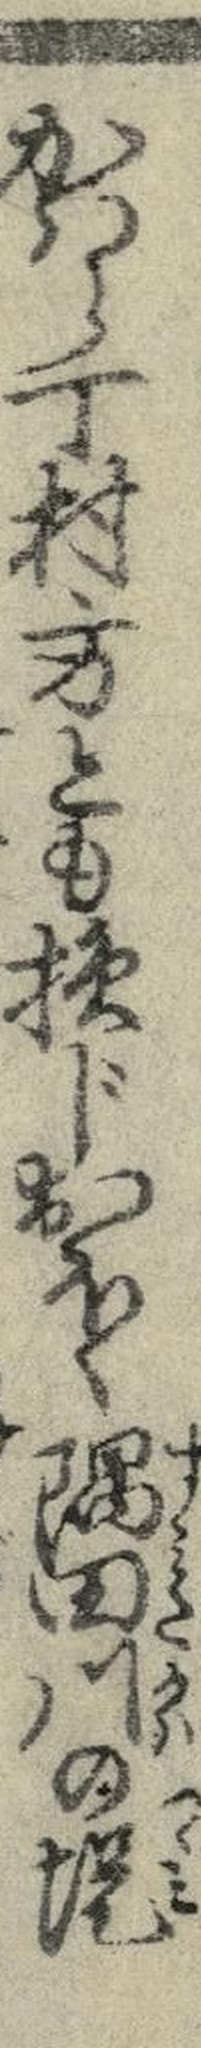かはら丁村方とも損じおほく隅田川の堤
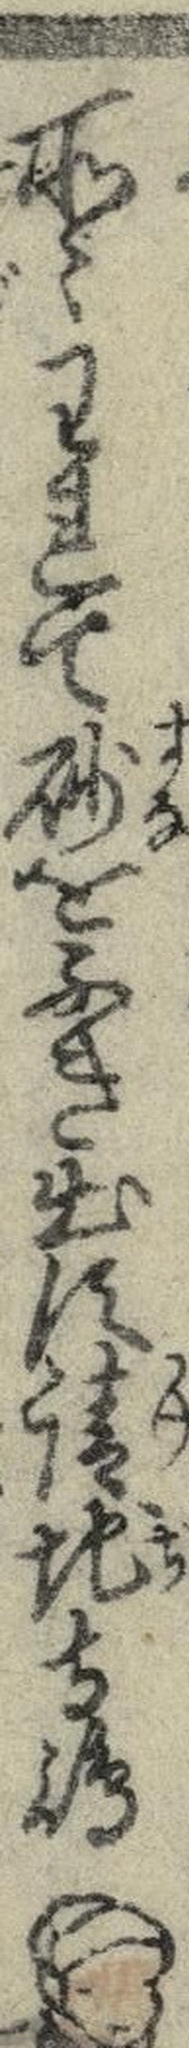所々われて砂をふき出す請地寺島
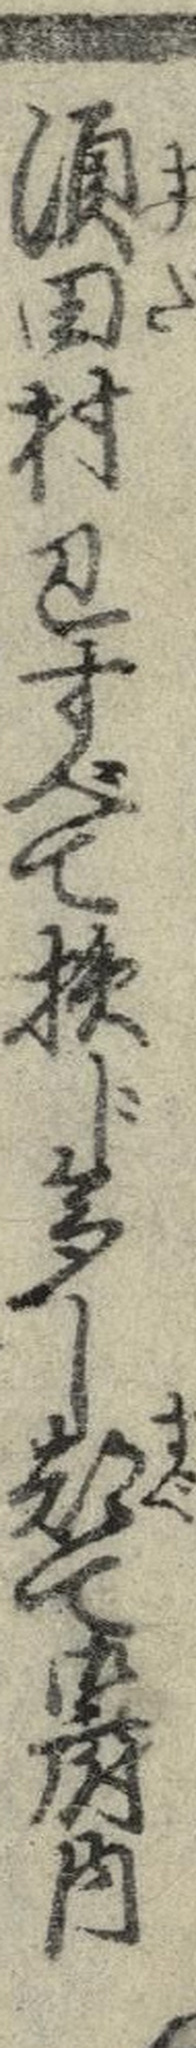須田村辺すべて損じ多し都て御府内
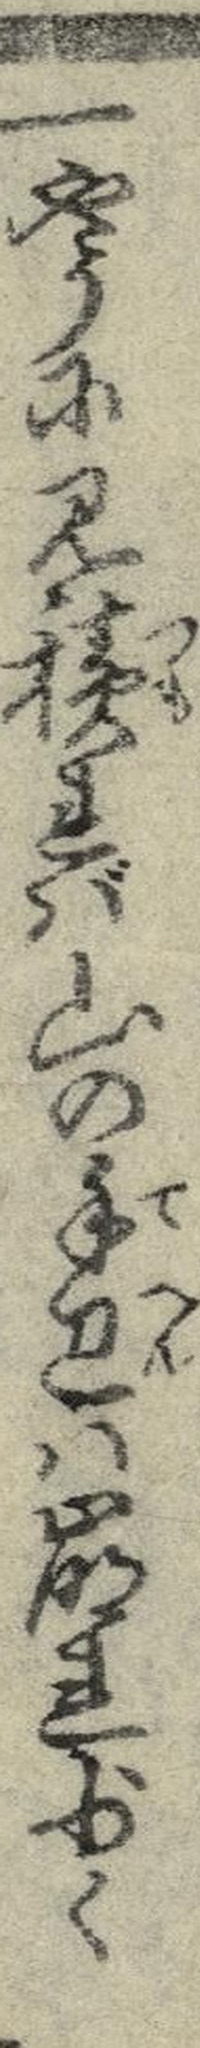一やうに見積れバ山の手辺ハ崩れ少く
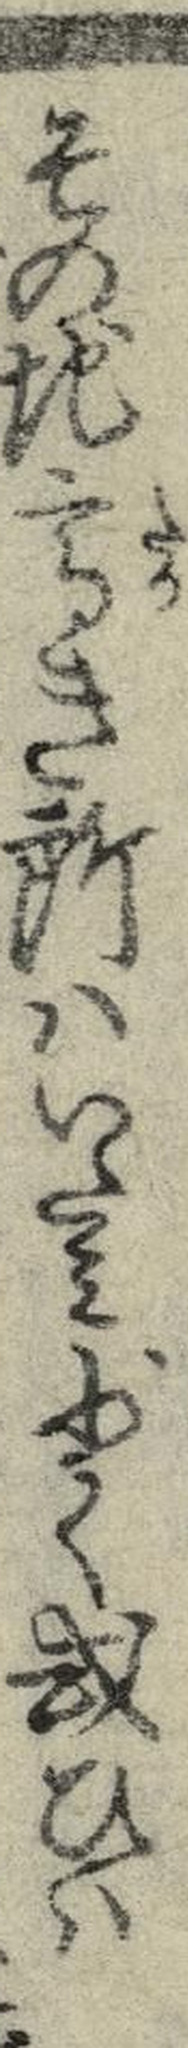その地高き所ハいたみ少く或ひハ
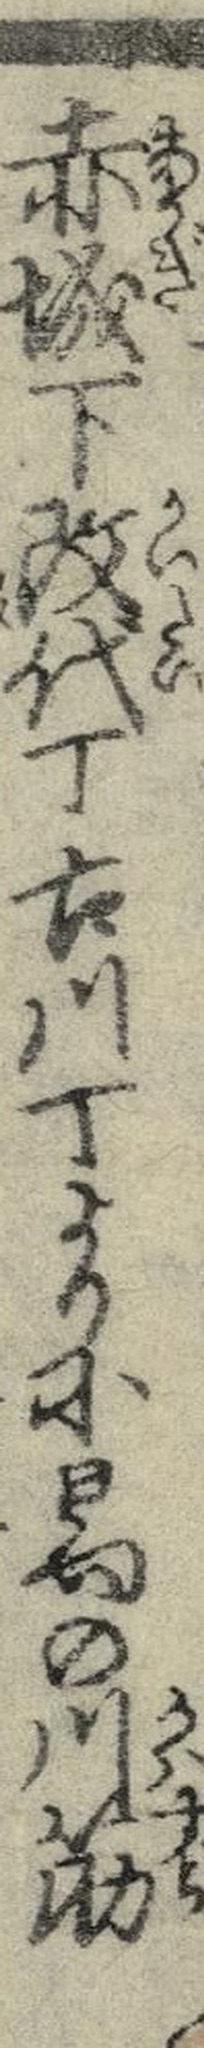赤城下改代丁古川丁より小日向の川筋
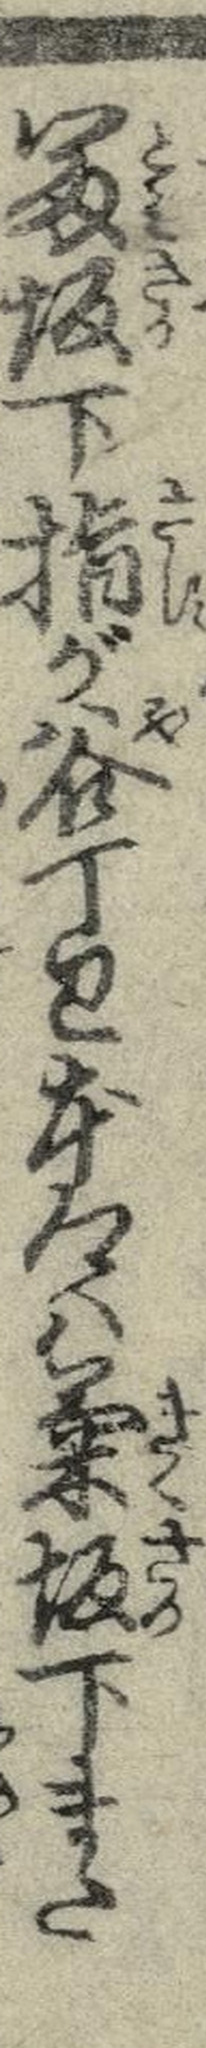富坂下指が谷丁辺本郷ハ菊坂下また
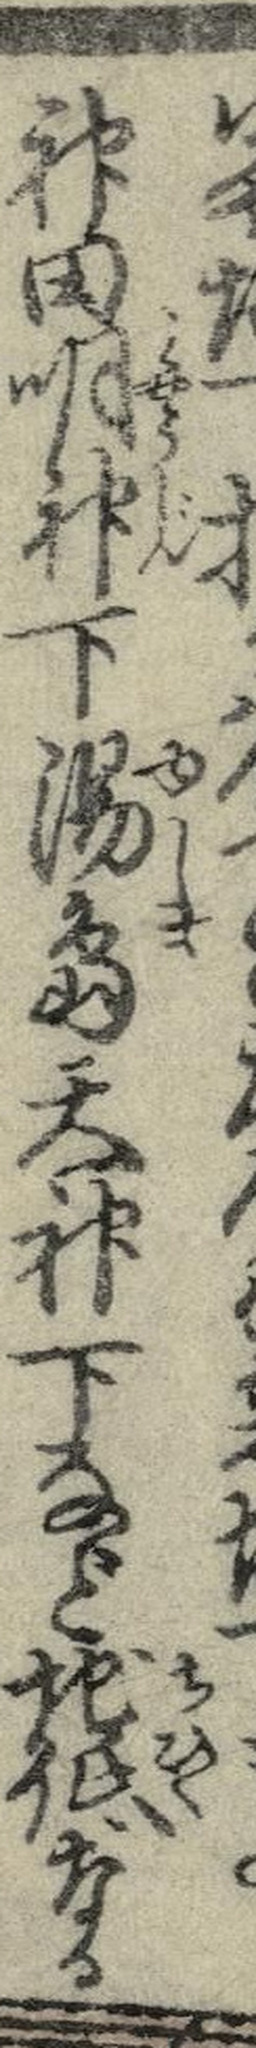神田明神下湯島天神下など地低なる
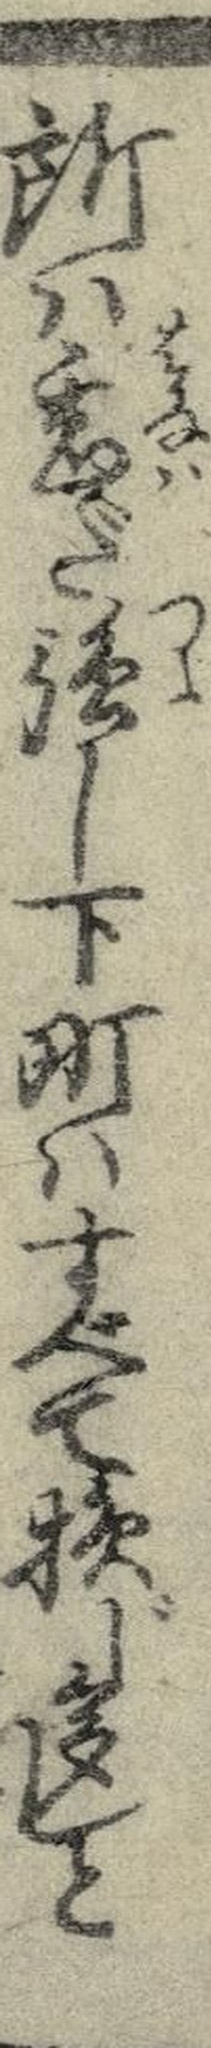所ハ甚だ強し下町ハすべて損じ多しと
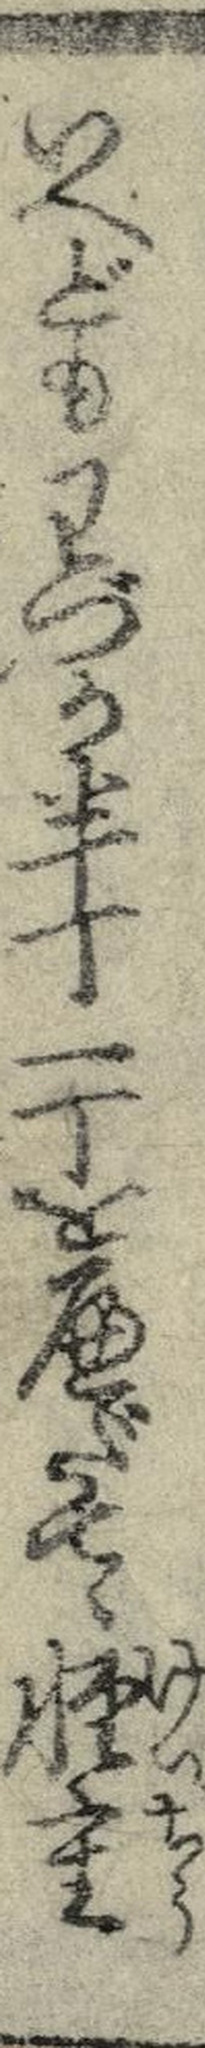いへどもわづか半丁一丁へだてゝ軽重
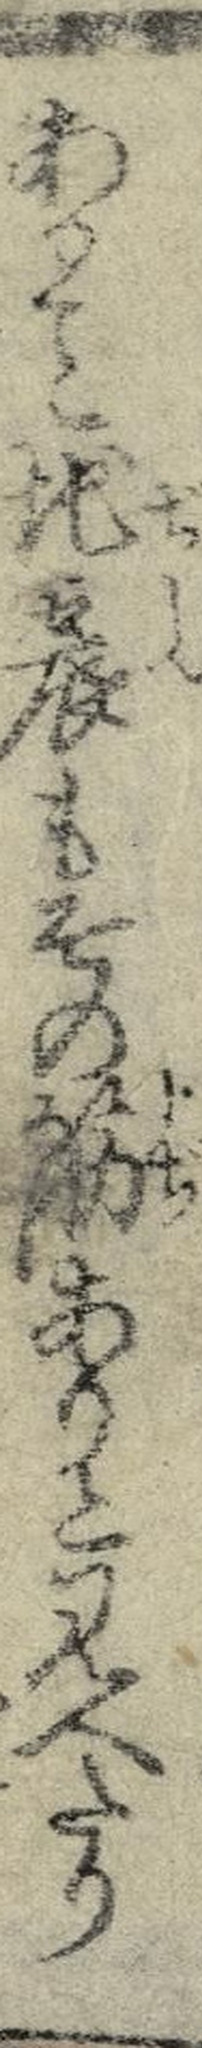あること地震もその筋ありと見へたり
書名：地震並出火細見記
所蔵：東京大学地震研究所図書室 Earthquake Research Institute Library, The University of Tokyo, JAPAN
